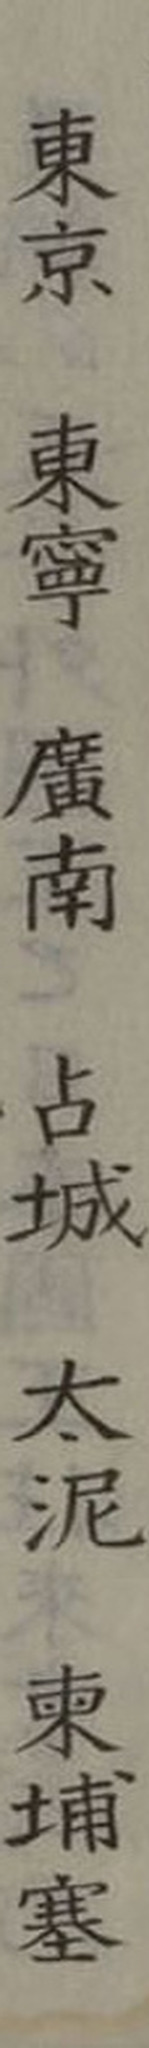東京東寧廣南占城太泥東埔塞
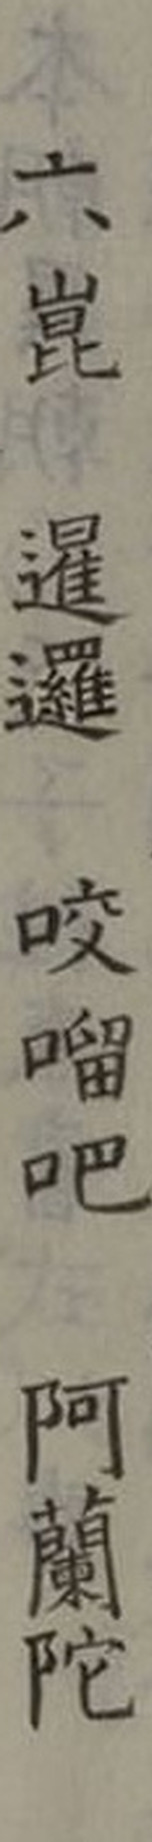六崑暹邏咬𠺕吧阿蘭陀
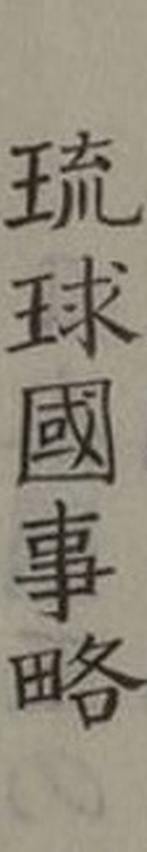琉球國事略
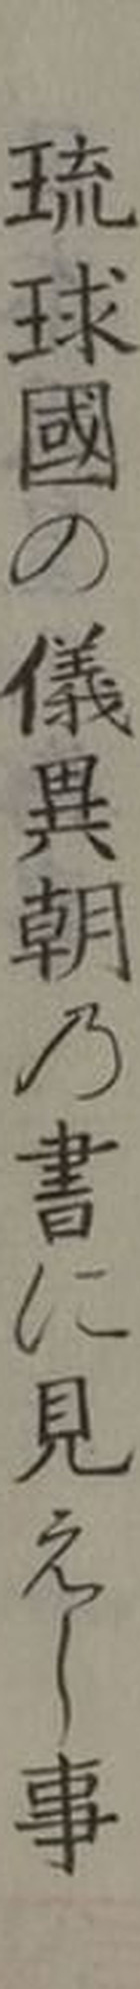琉球國の儀異朝の書に見えし事
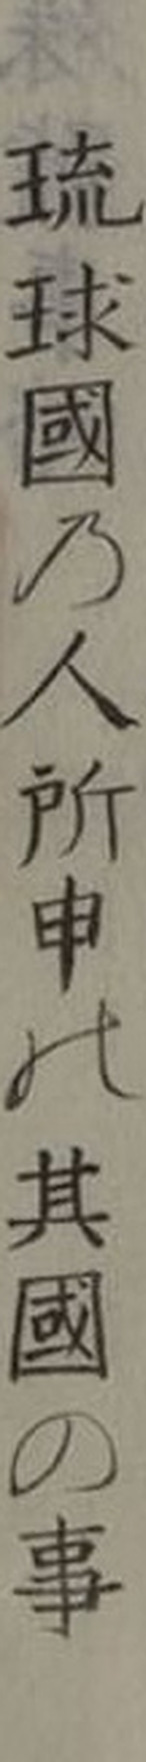琉球國の人所申の其國の事
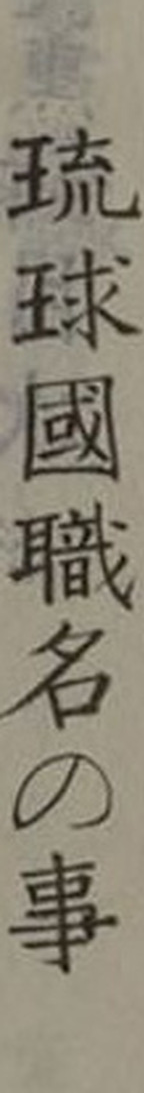琉球國職名の事
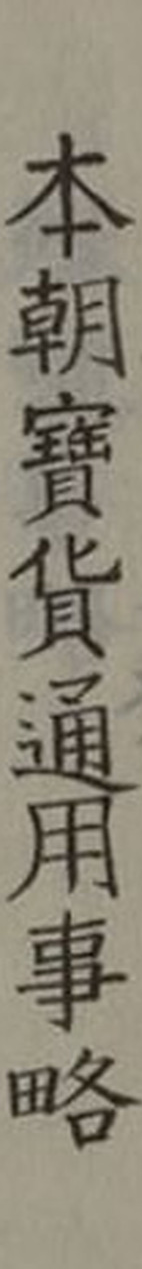本朝寶貨通用事略
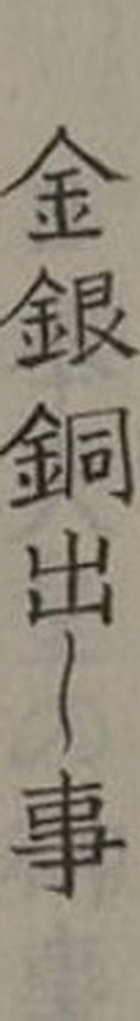金銀銅出し事
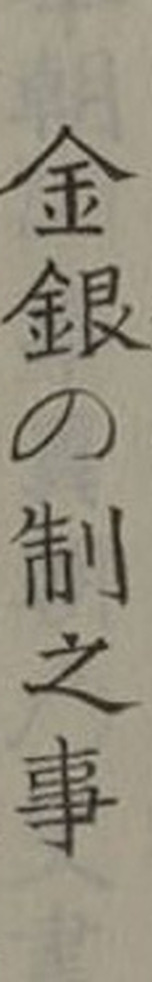金銀の制之事
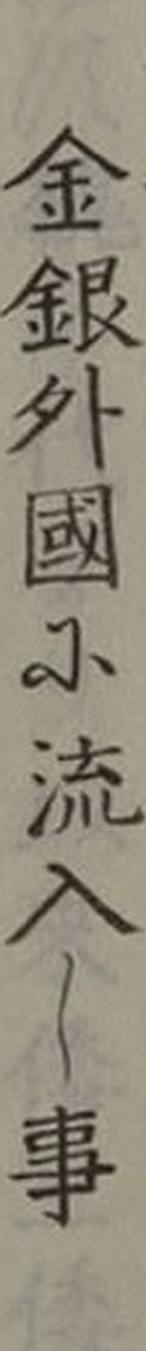金銀外國に流入し事
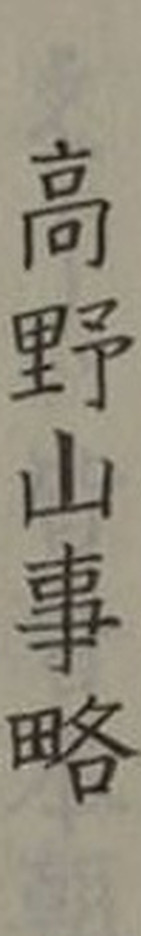高野山事略
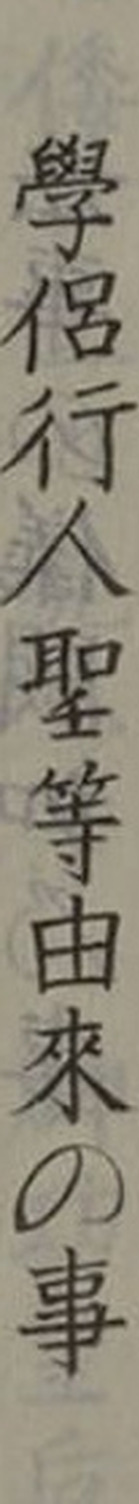學侶行人聖等由來の事
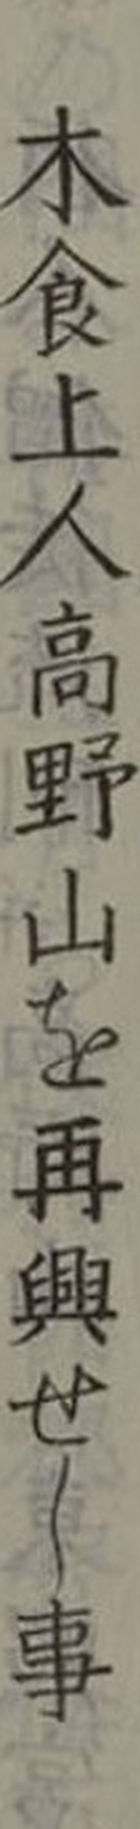木食上人高野山を再興せし事
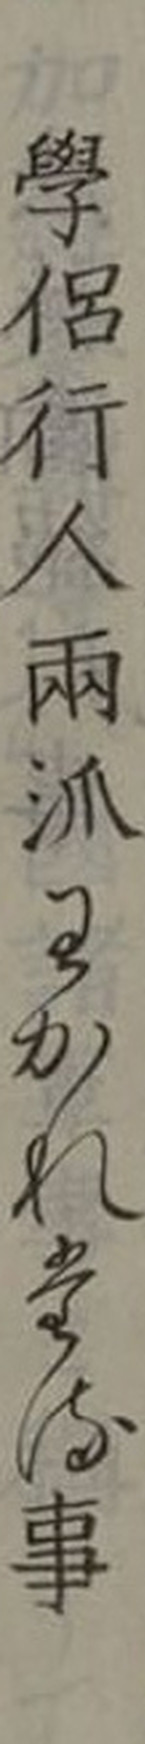學侶行人兩派わかれたる事
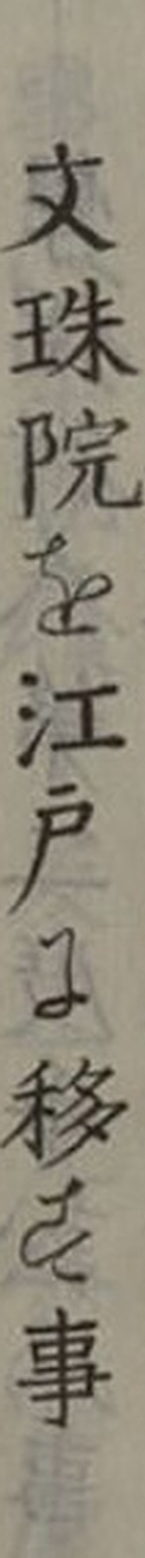文珠院を江戸に移す事
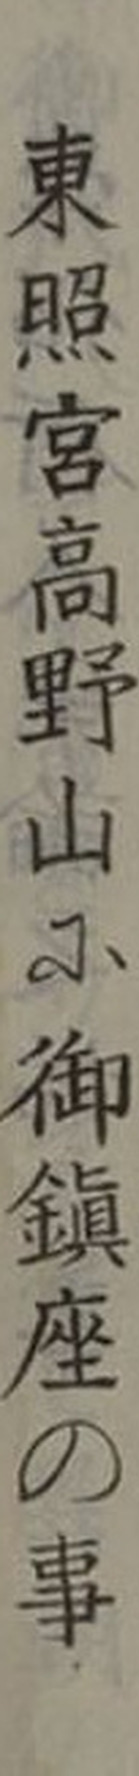東照宮高野山に御鎮座の事
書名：骨董録
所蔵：University of the Ryukyus Library
